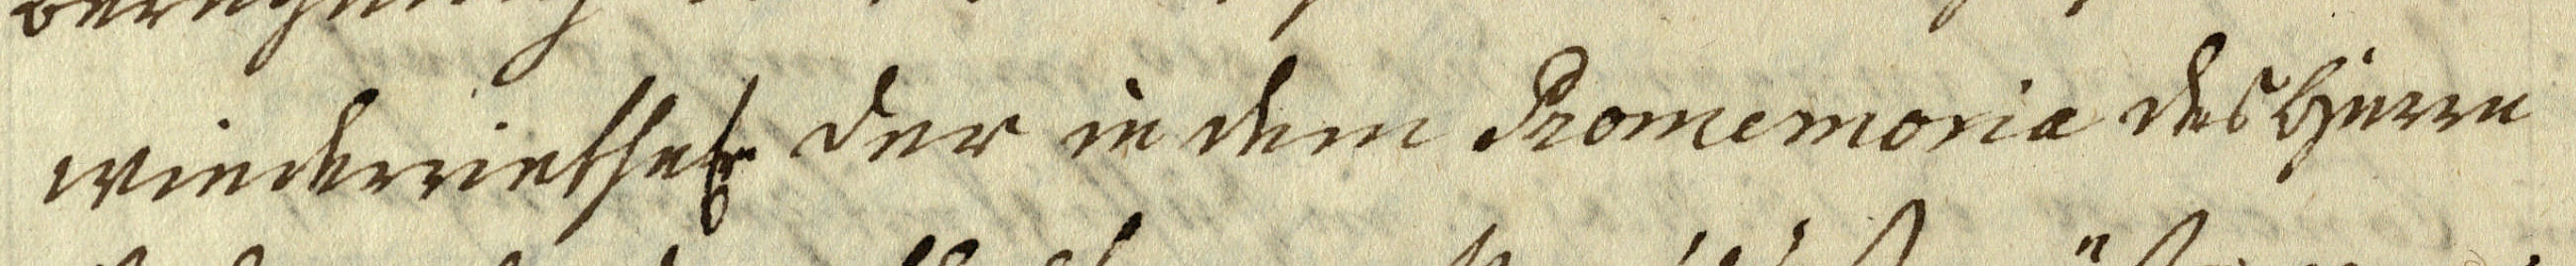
wiederriethe Er der in dem Promemoria des Herrn
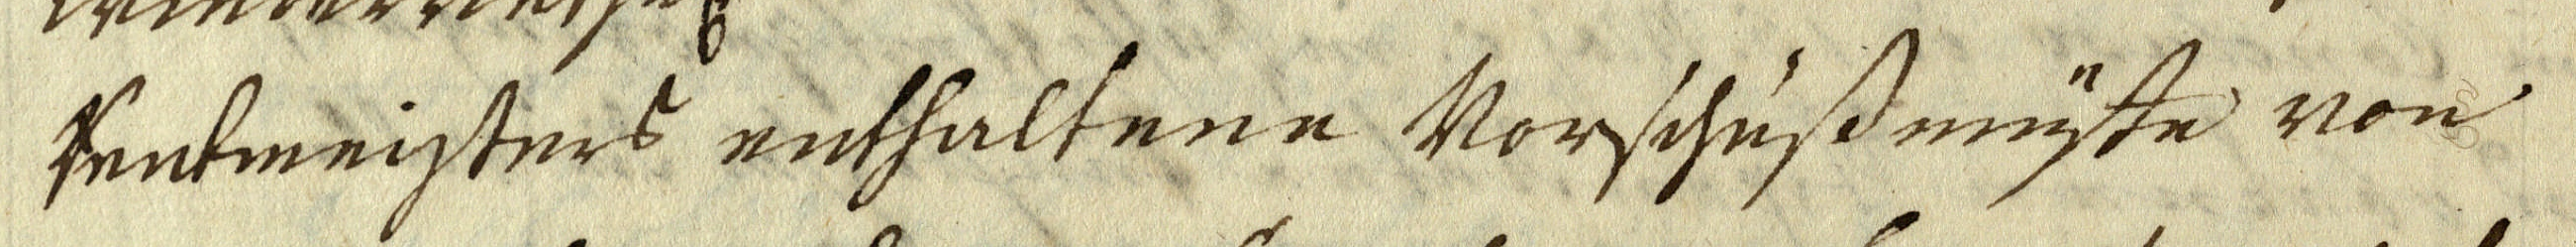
Rentmeisters enthaltene Vorschuß müßte von
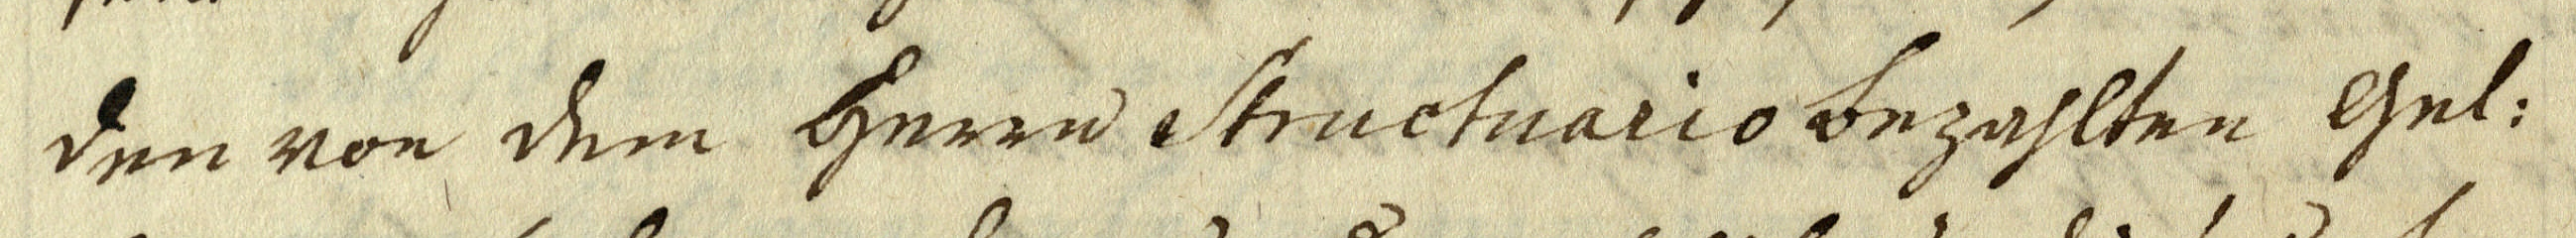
den von dem Herrn Structuario bezahlten Gel¬
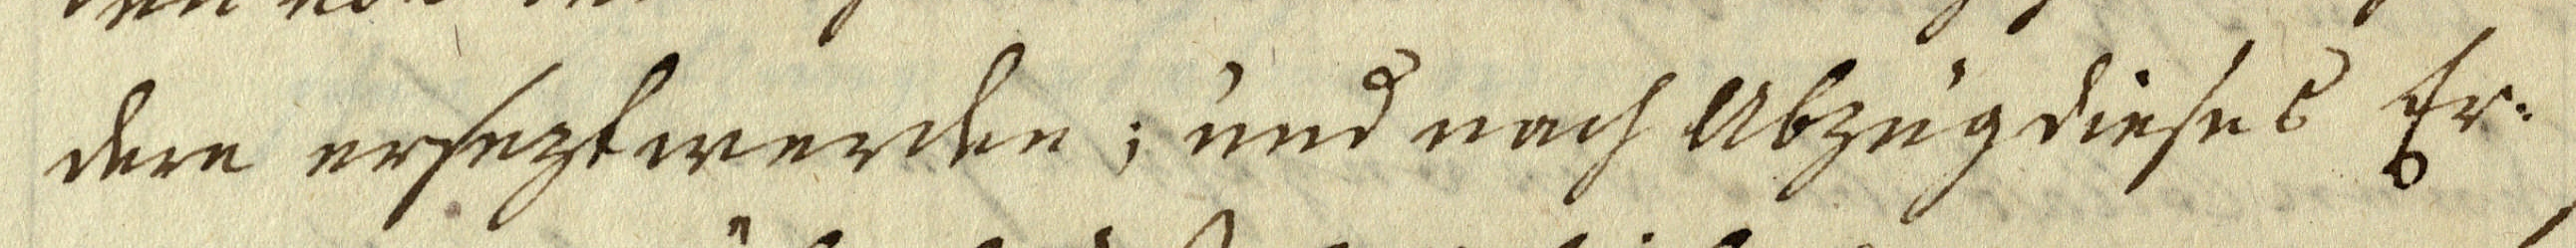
dern ersezt werden; und nach Abzug dieses Er¬
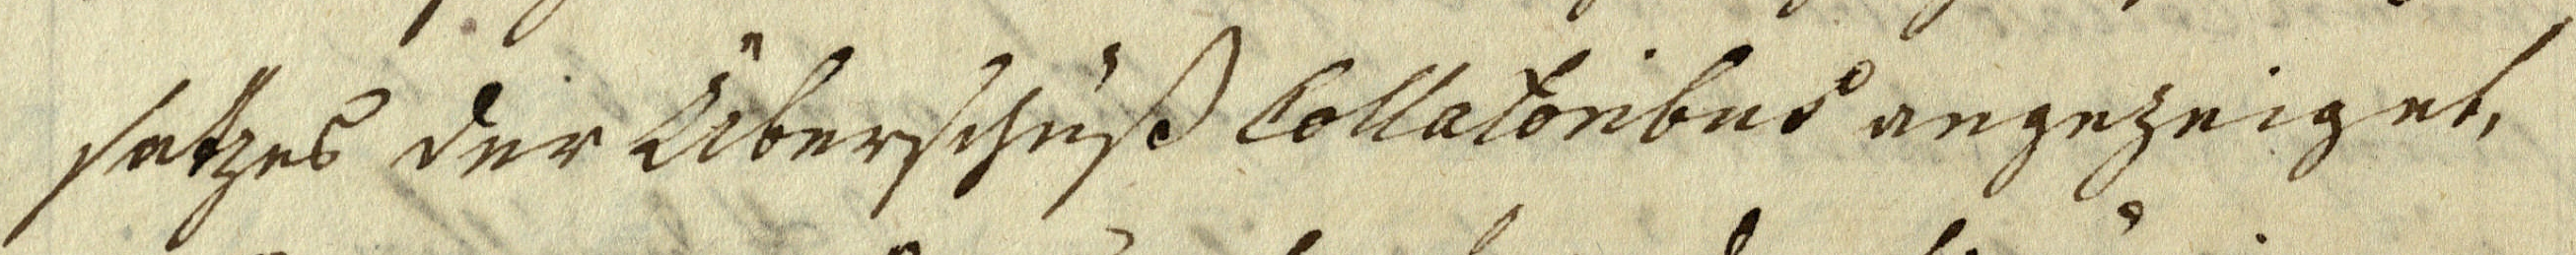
satzes derÜberschuß Collatoribus angezeiget,
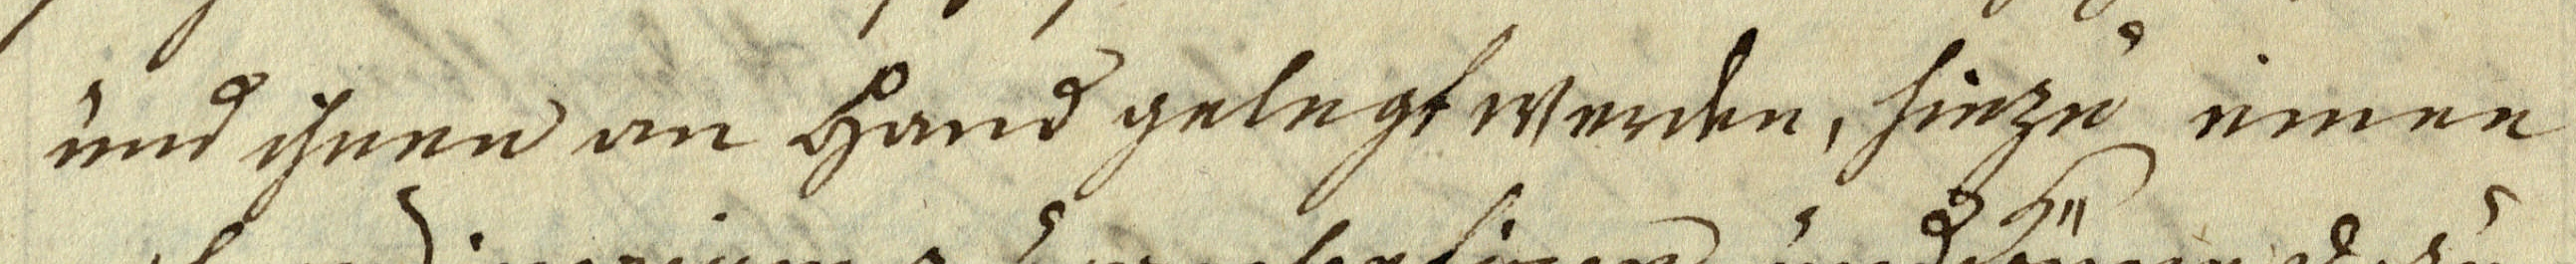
und ihnen an Hand gelegt werden, hiezu einen
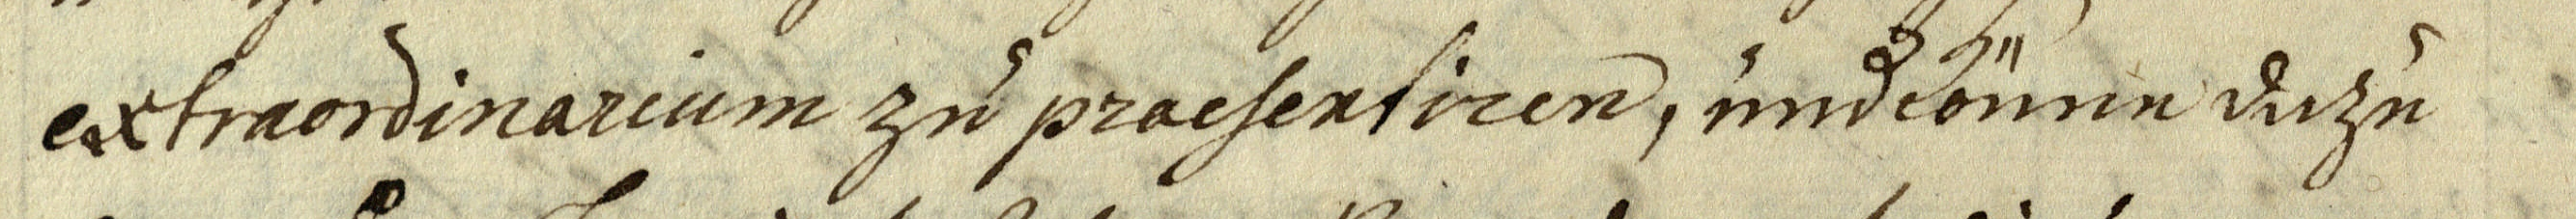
extraordinarium zu praesentiren, und könne dazu
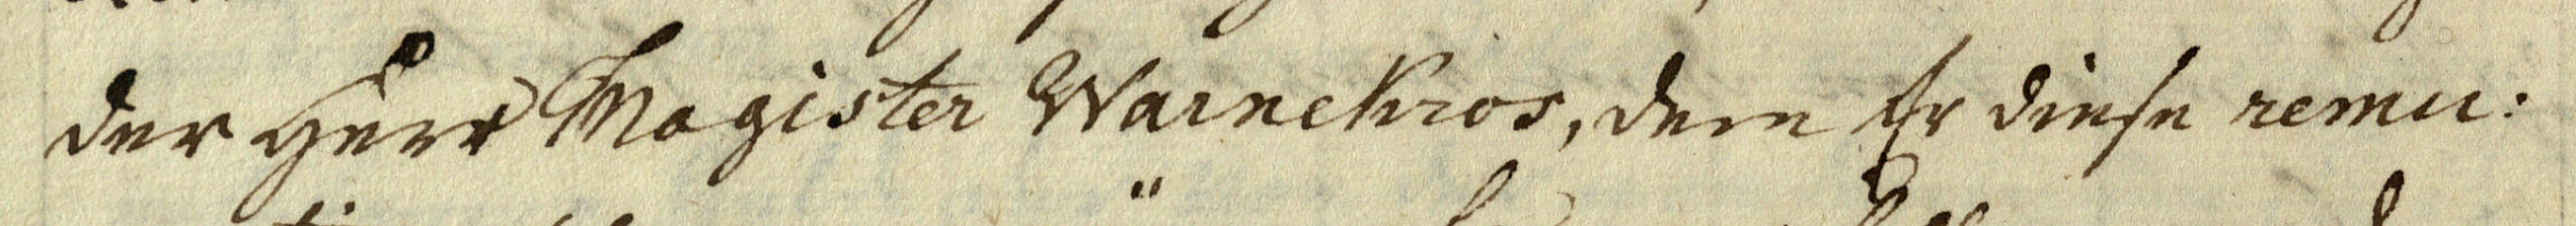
der Herr Magister Warnekros, dem Er diese remu¬
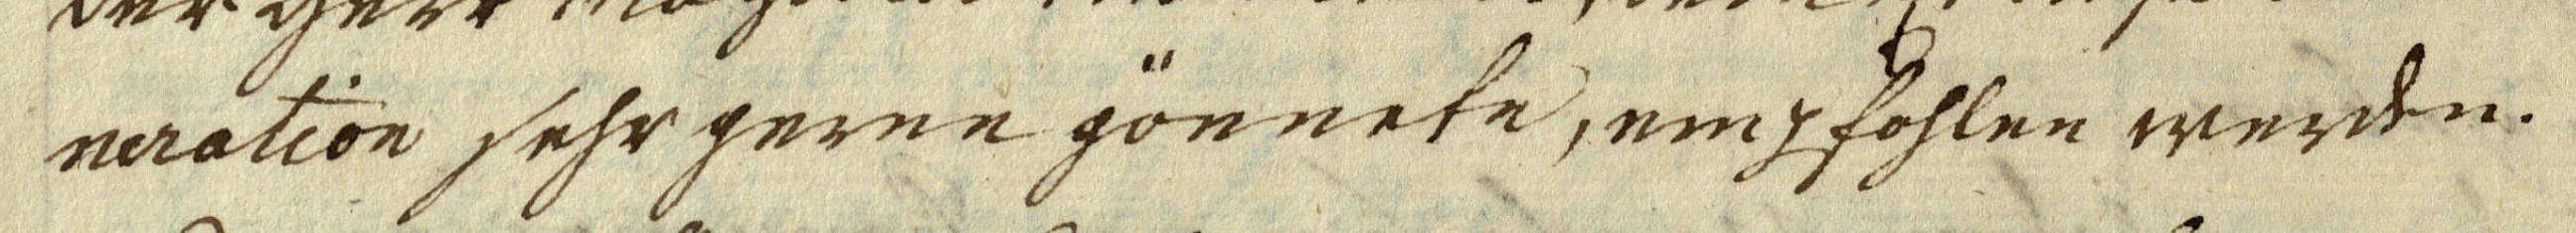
neration sehr gerne gönnete, empfohlen werden.
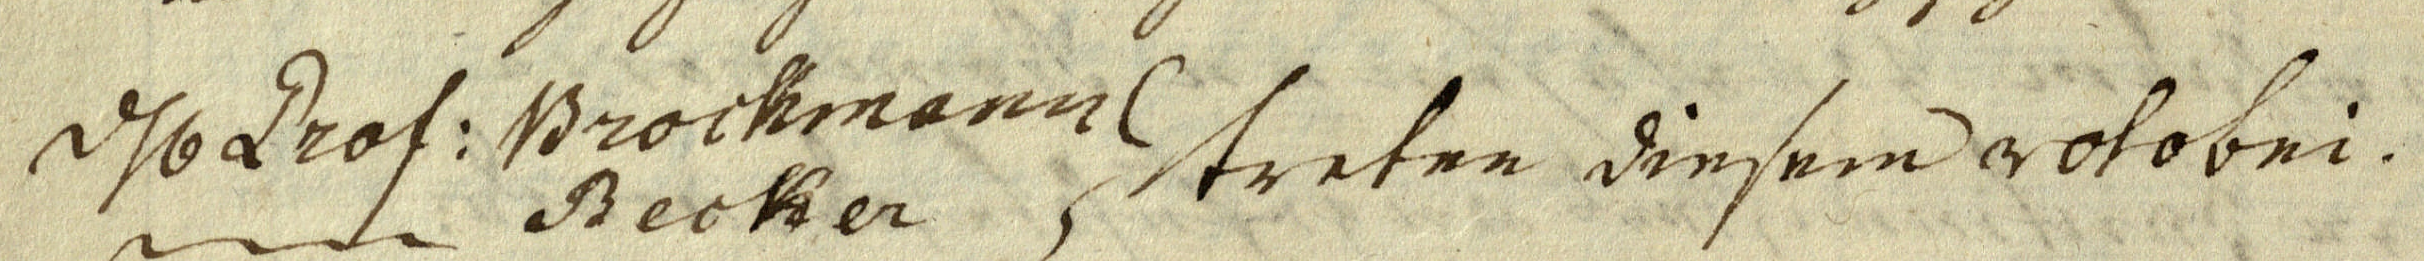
dh Prof. Brockmann treten diesem voto bei
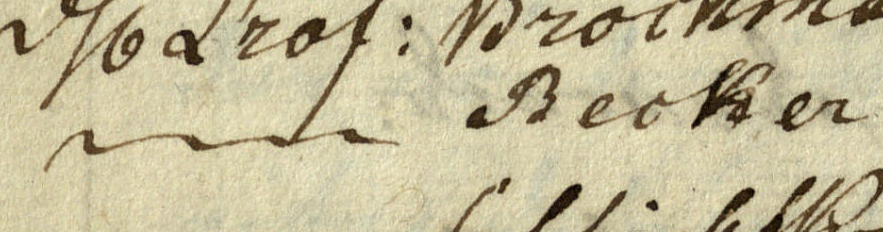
Becker
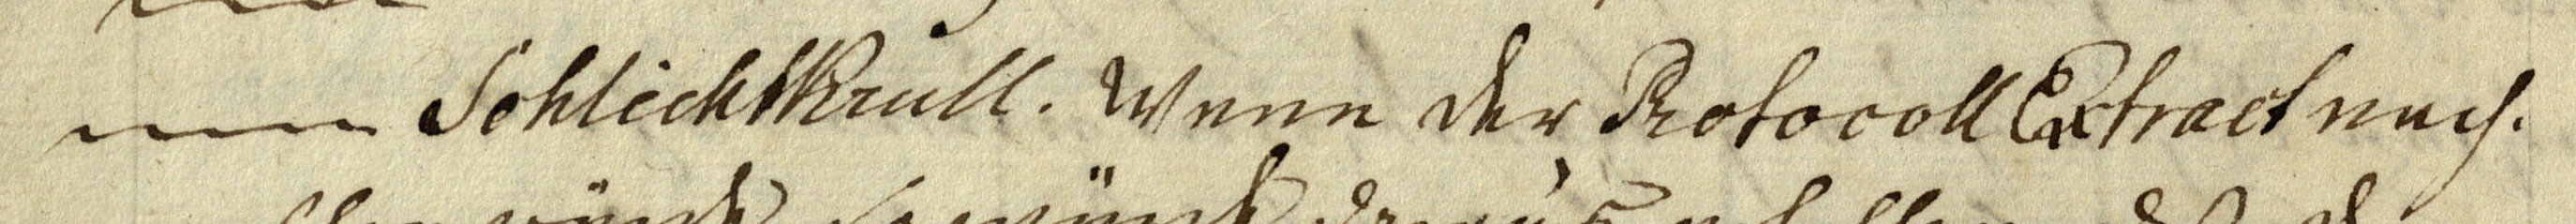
Schlichtkrull. Wenn der Protocoll Exract nach¬
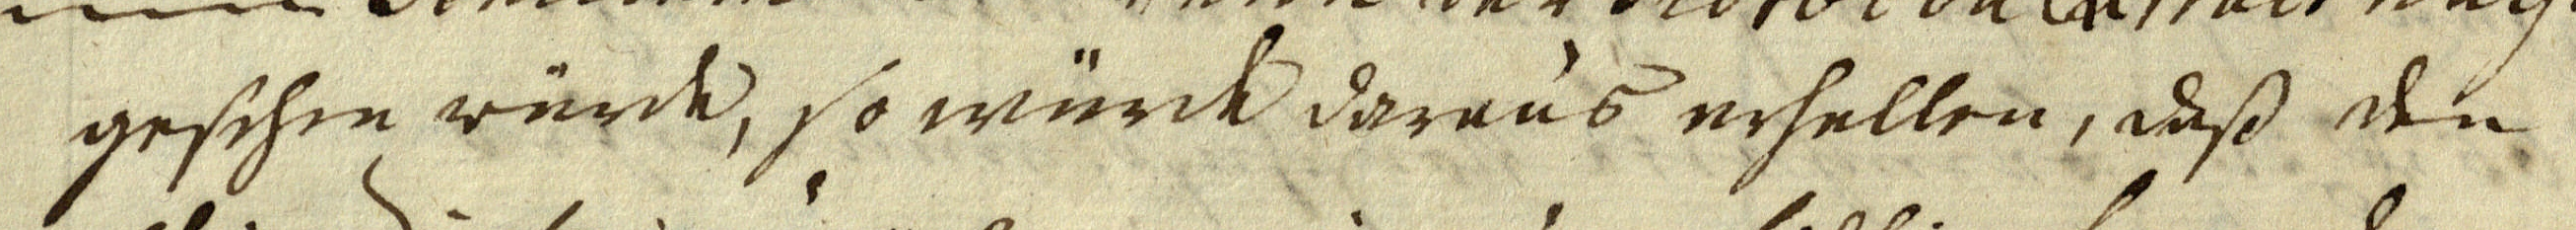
gesehen würde, so würde daraus erhellen, daß dem
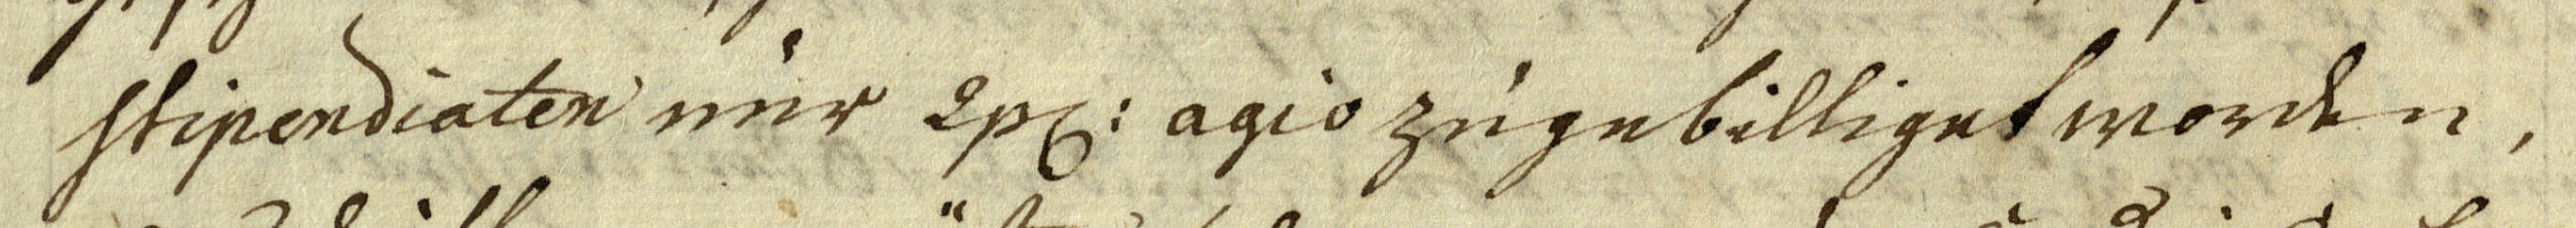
stipendiaten nur 2 p. zugebilliget worden.
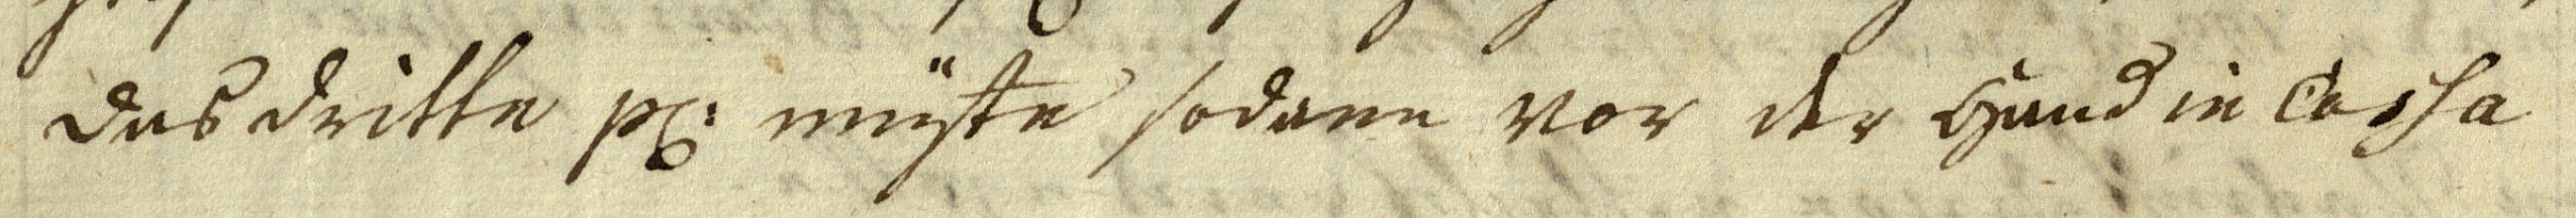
das dritte p. müßte sodann vor der Hand in Cassa
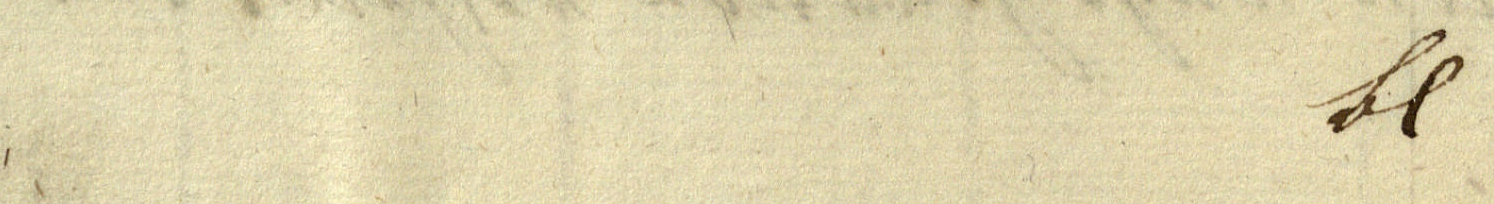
bl
